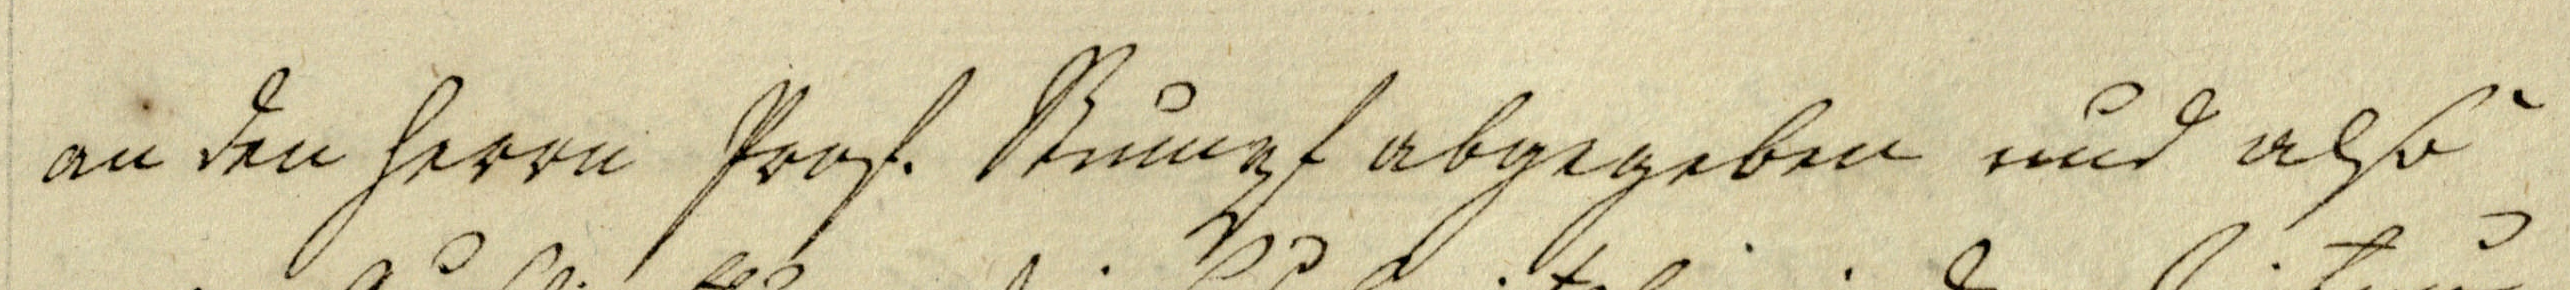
an den Herrn Prof. Stumpf abgegeben und also
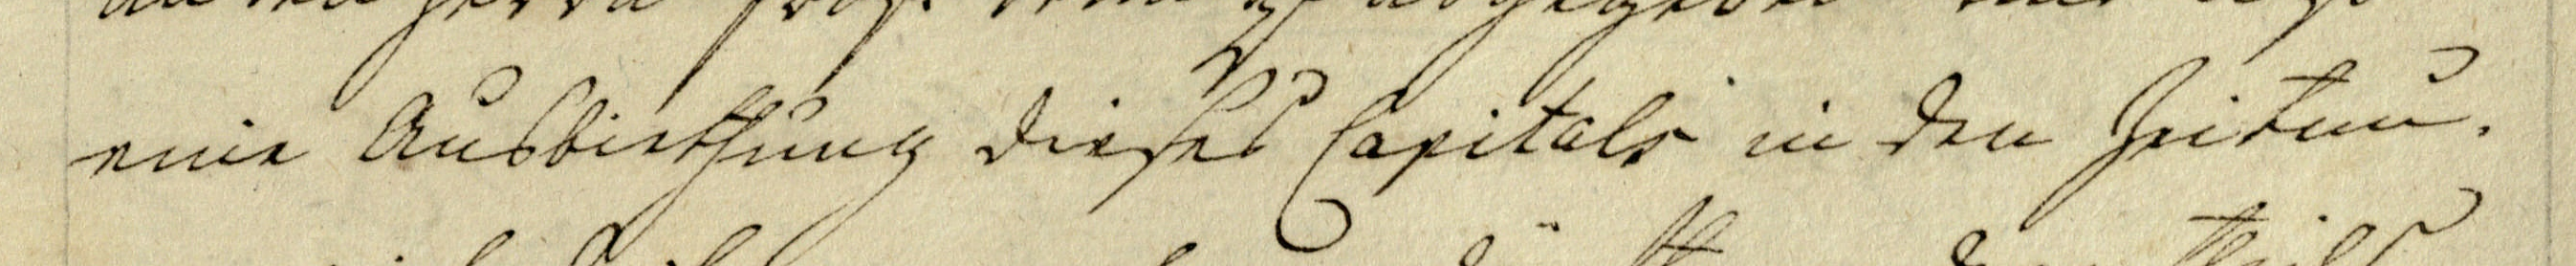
eine Ausbiethung dieses Capitals in den Zeitun¬
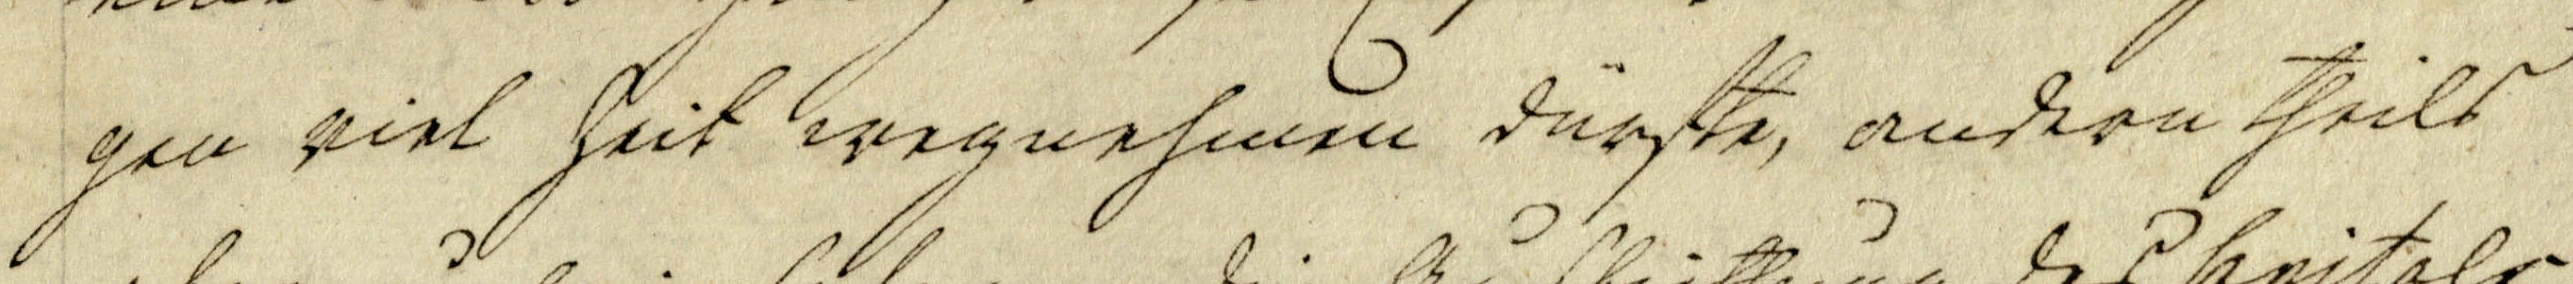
gen viel Zeit wegnehmen dürfte, andern theils
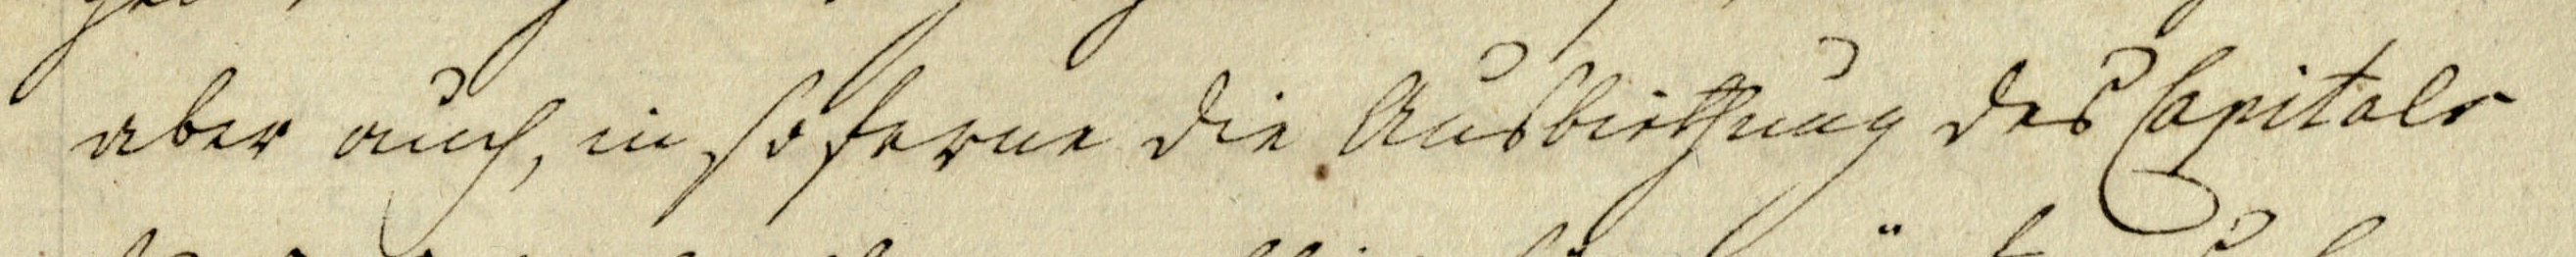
aber auch, in so ferne die Ausbiethung des Capitals
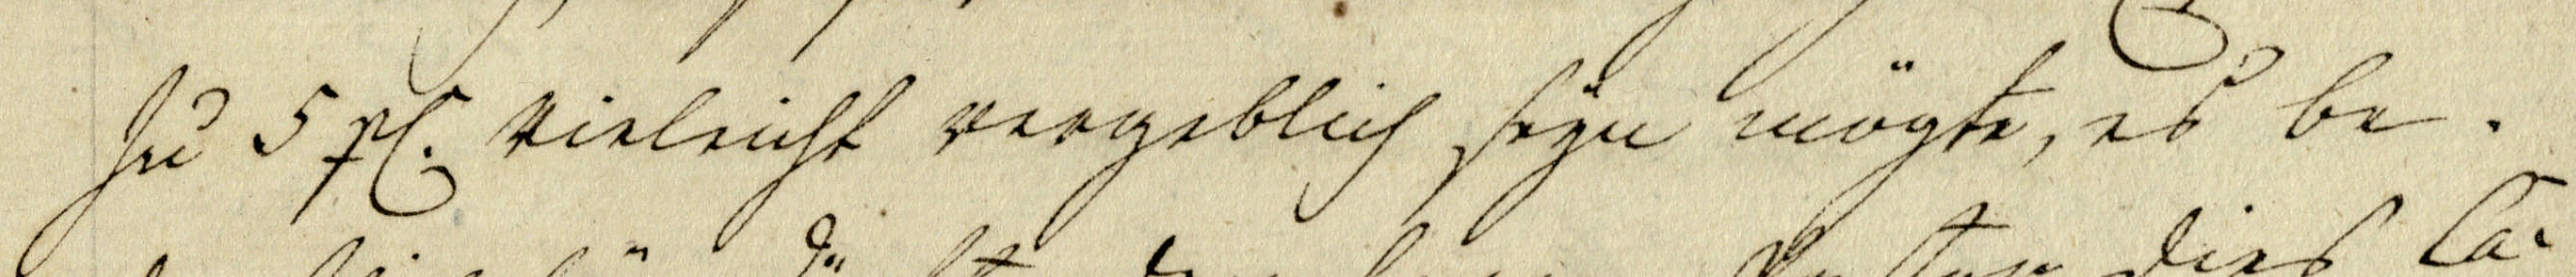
zu 5 pl. vieleicht vergeblich seÿn mögte, es be¬
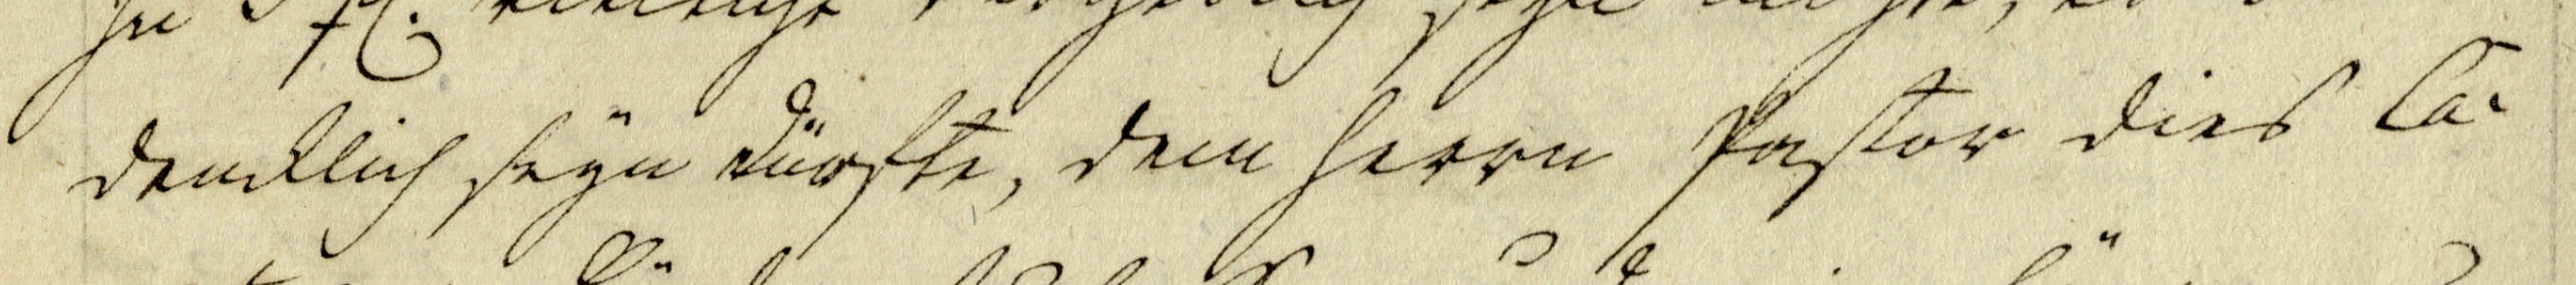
dencklich seÿn dürfte, dem Herrn Pastor dies Ca¬
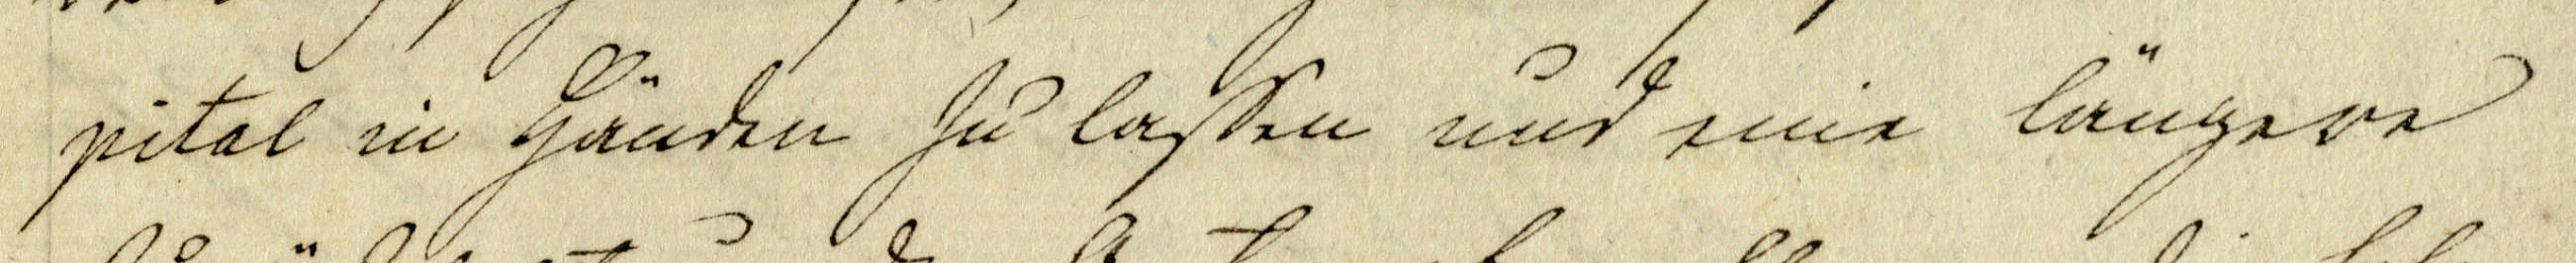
pital in Händen zu lassen und eine längere
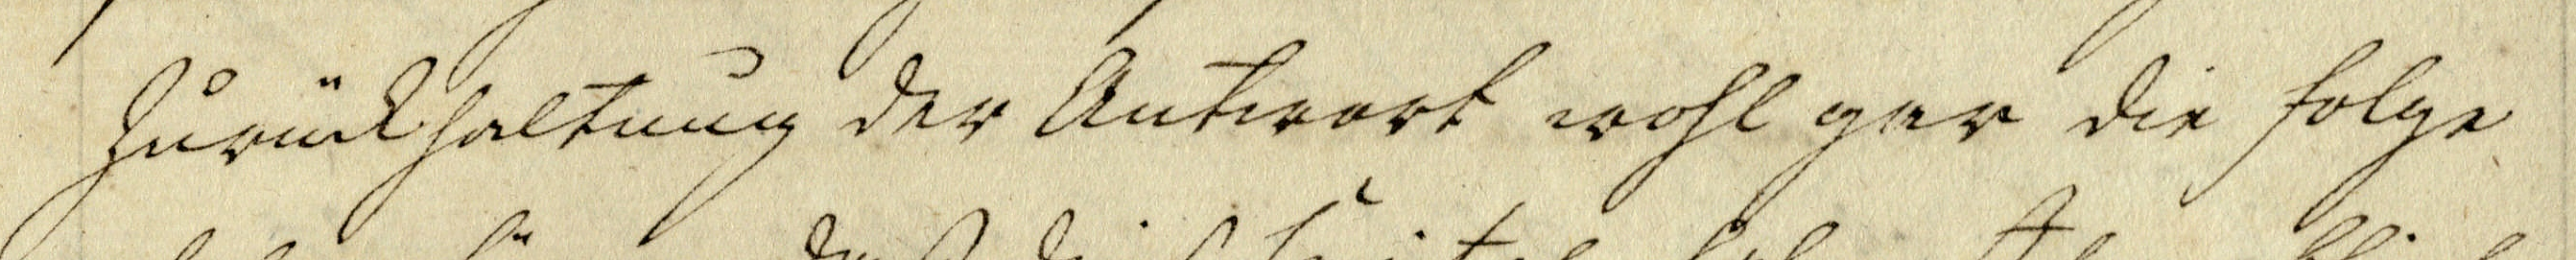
Zurückhaltung der Antwort wohl gar die Folge
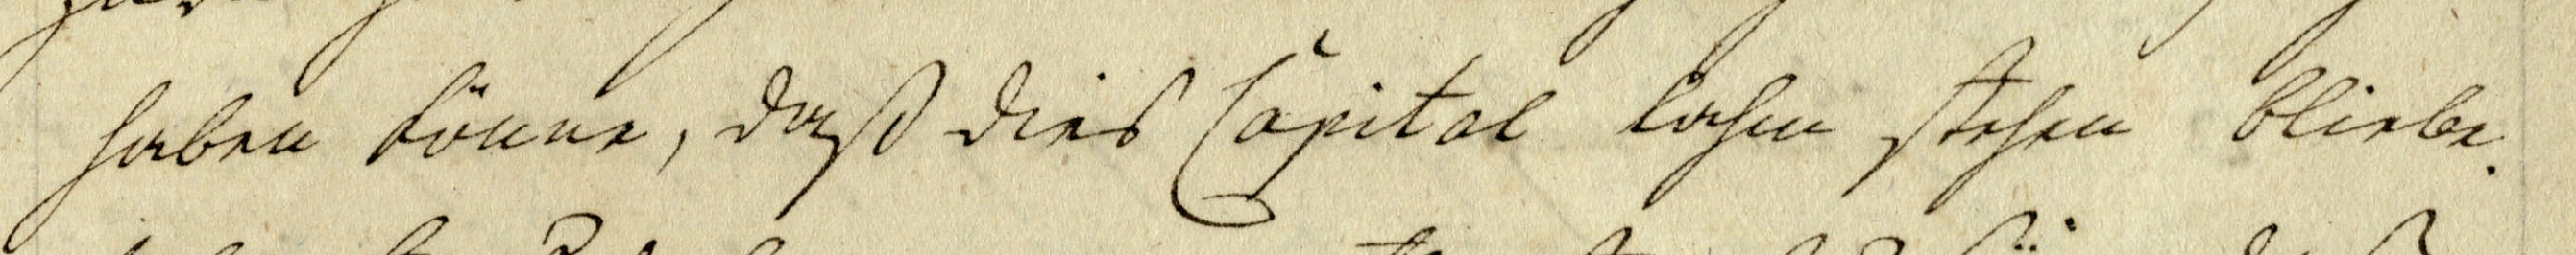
haben könne, daß dies Capital lahm stehen bliebe.
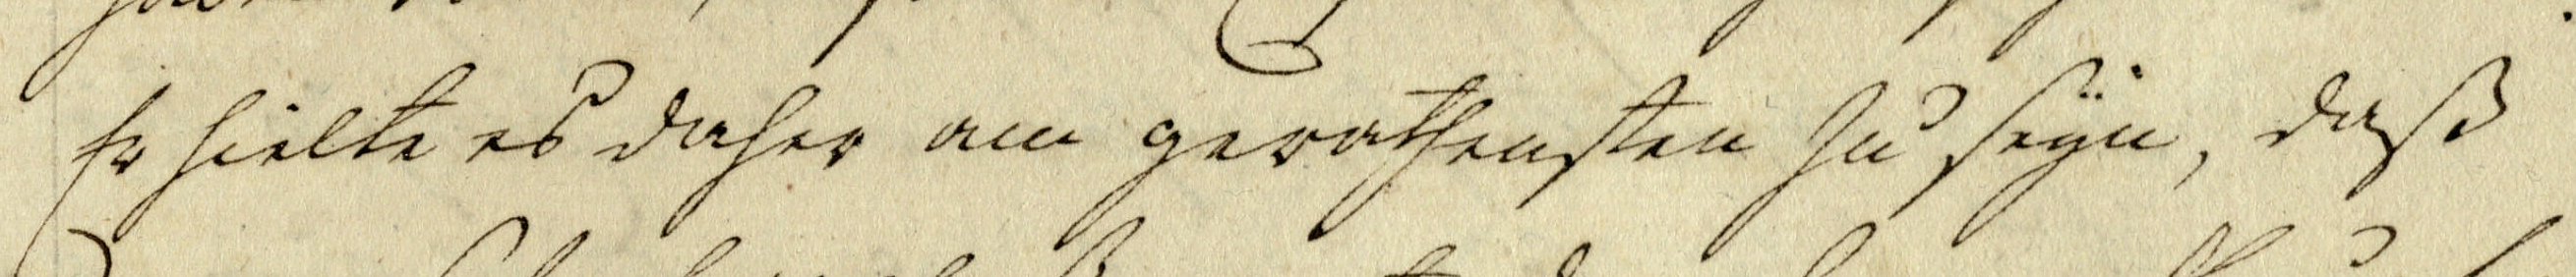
Er hielte es daher am gerathensten zu seÿn, daß
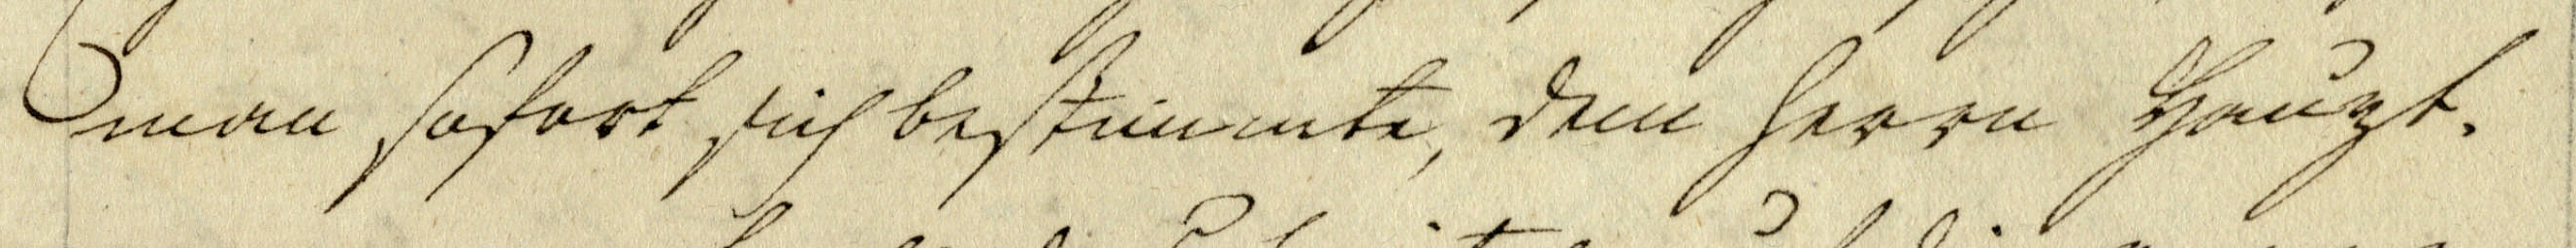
man sofort sich bestimmte, dem Herrn Haupt¬
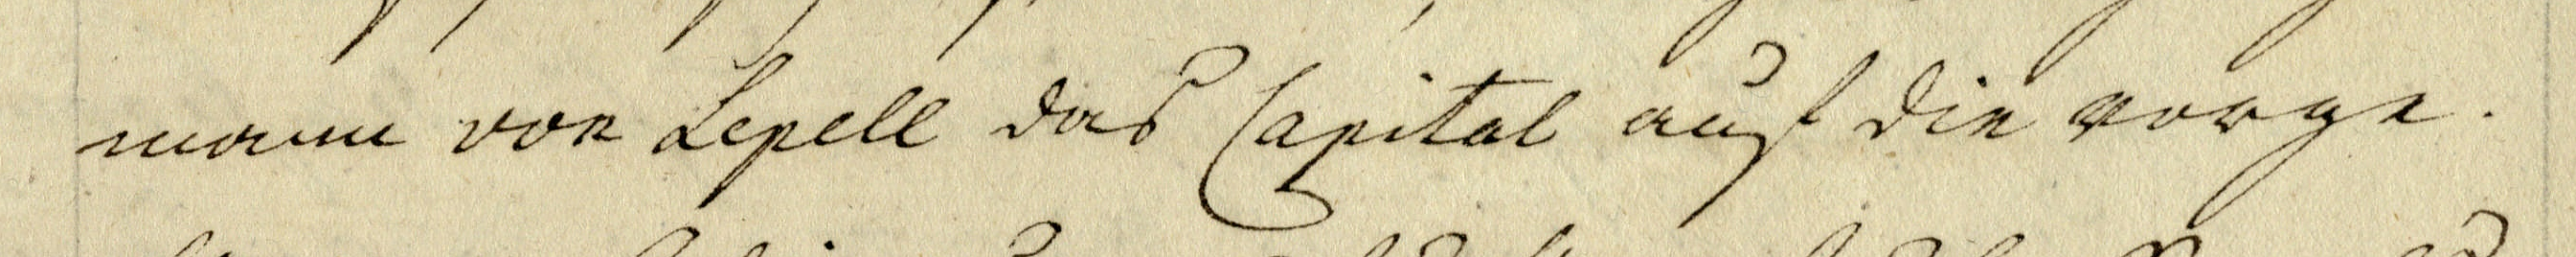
mann von Lepell das Capital auf die vorge¬
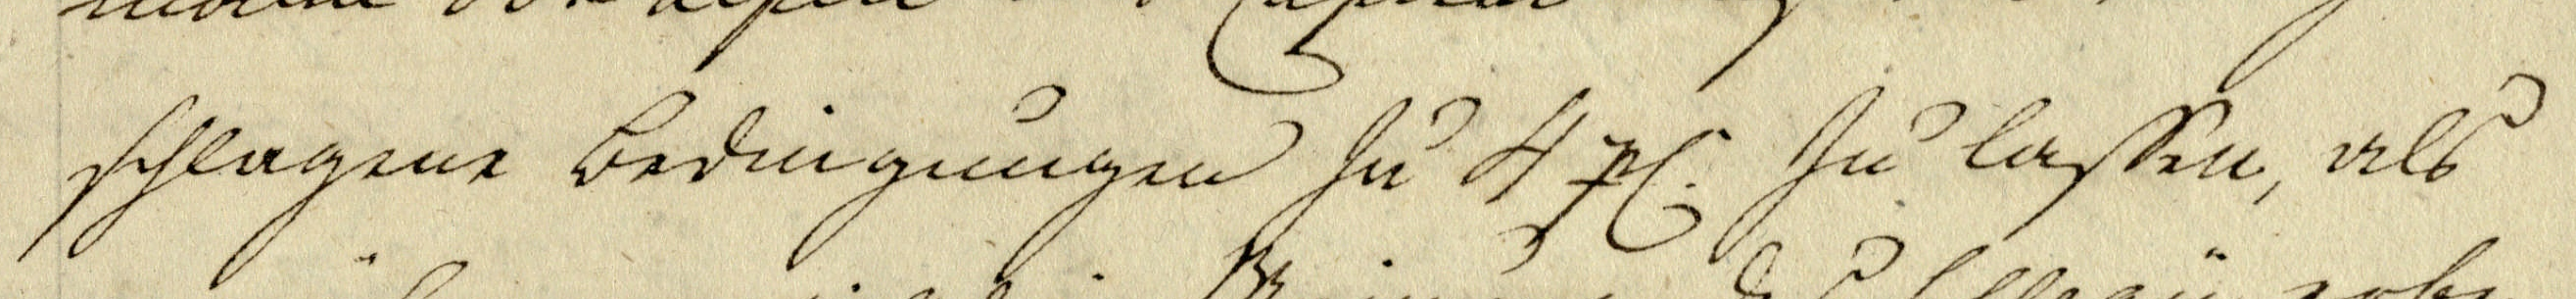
schlagene Bedingungen zu 4 pl. zu lassen, als
